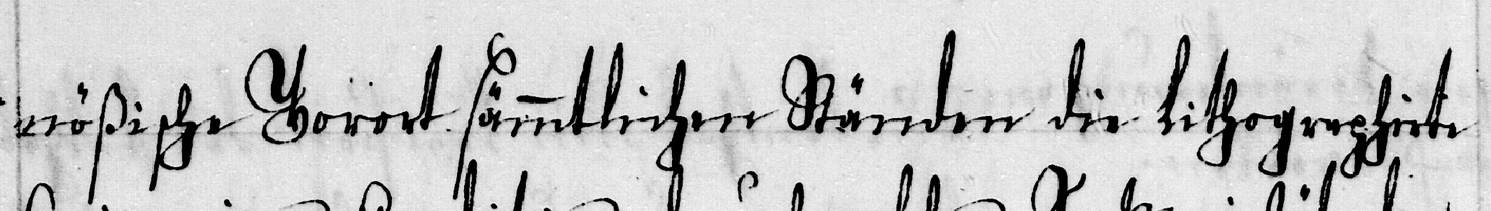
nößische Vorort sämmtlichen Ständen die Lithographirte
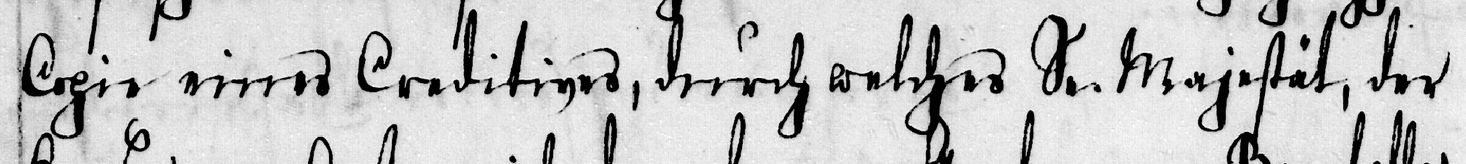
Copie eines Creditives, durch welches S. Majestät, der
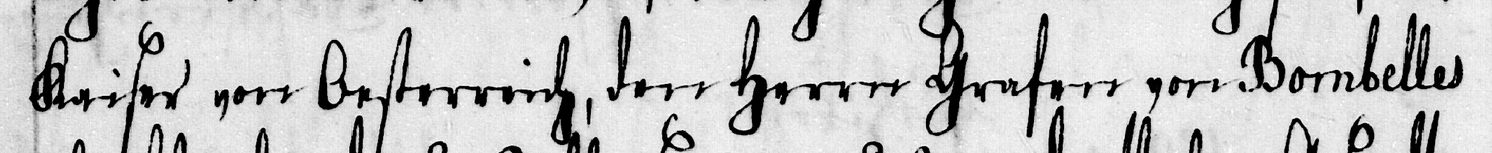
Kaiser von Oesterreich, den Herrn Grafen von Bombelles
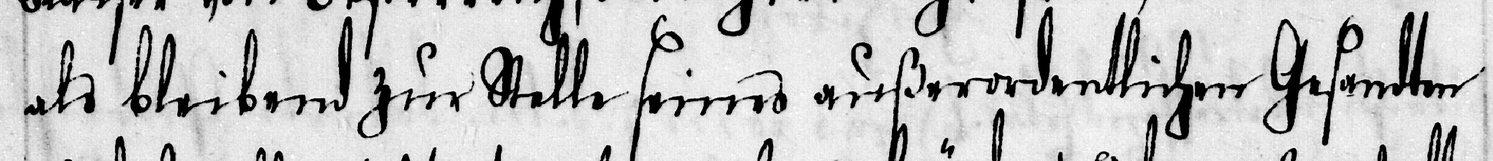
als bleibend zur Stelle seines außerordentlichen Gesandten
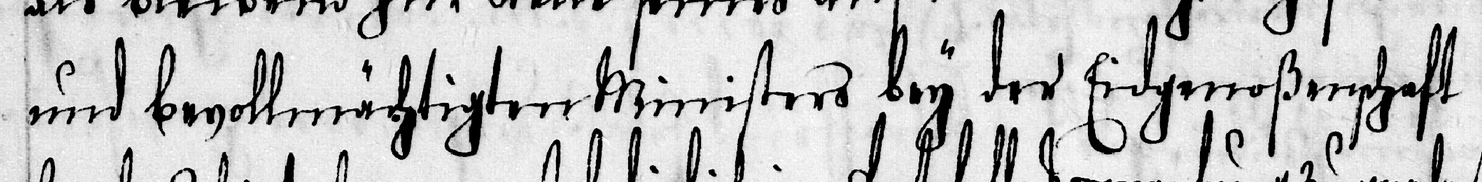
und bevollmächtigten Ministers bey der Eidgenoßenschaft
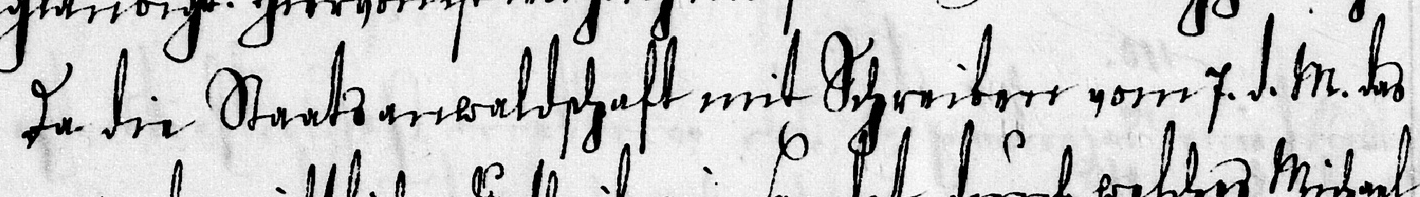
Da die Staatsanwaldschaft mit Schreiben vom 7. d. M. das
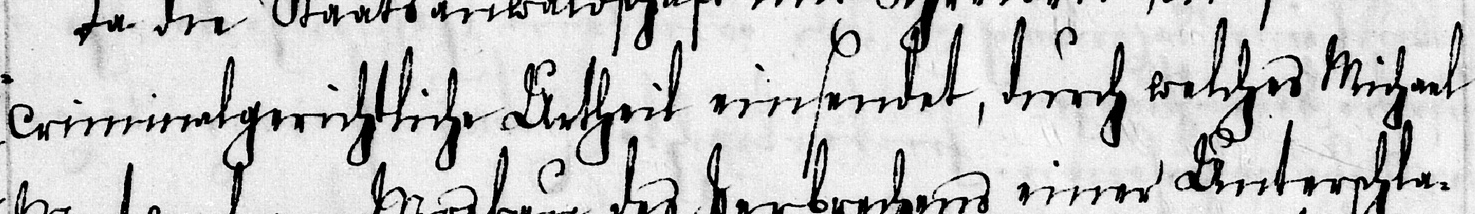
criminalgerichtliche Urtheil einsendet, durch welches Michael
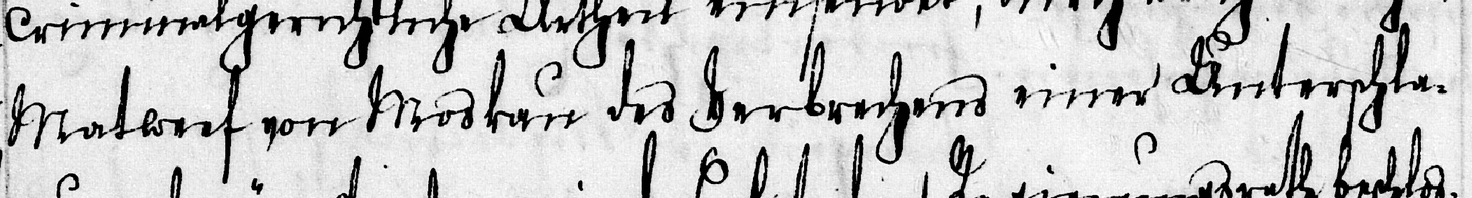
Matweef von Moskau des Verbrechens einer Unterschla¬
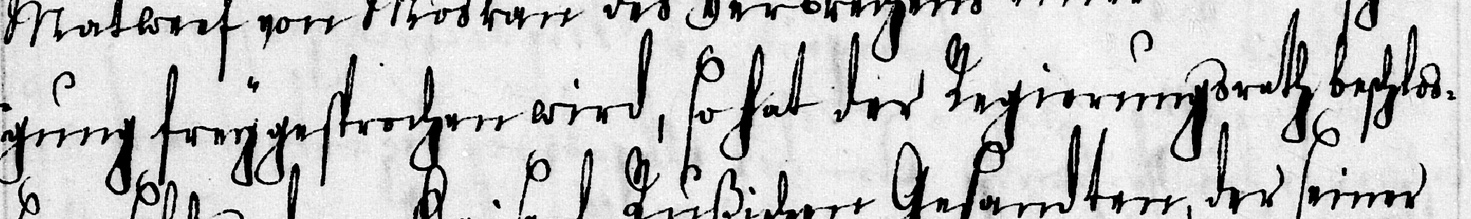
gung freygesprochen wird, so hat der Regierungsrath beschlo¬
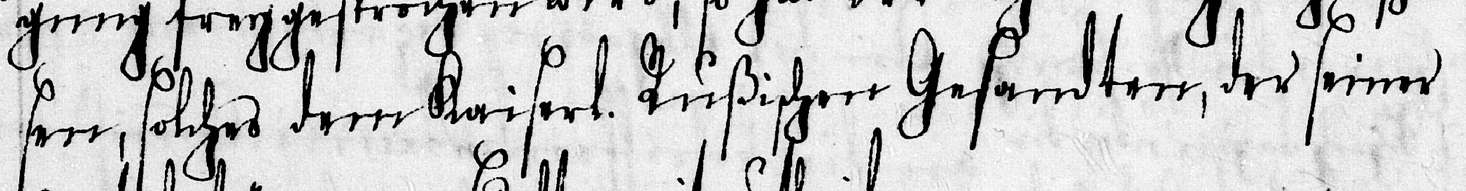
ßen, solches dem Kaiserl. Rußischen Gesandten, der seiner
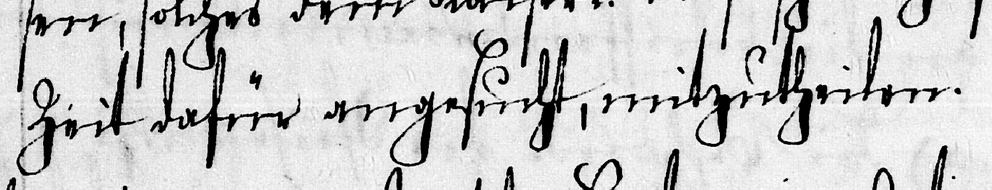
Zeit dafür angesucht, mitzutheilen.
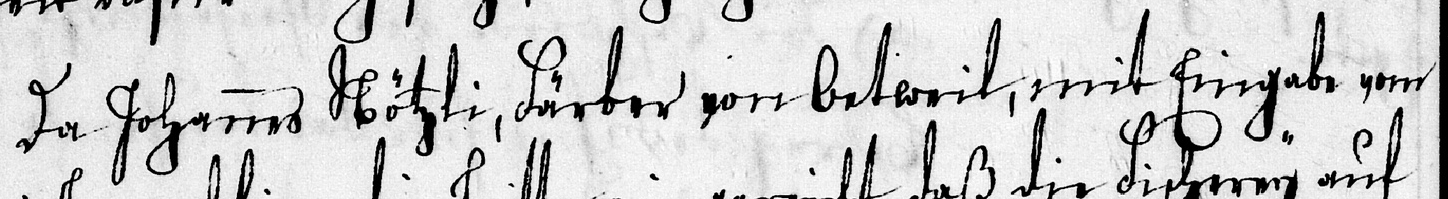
Da Johannes Nötzli, Färber von Oetweil, mit Eingabe vom
